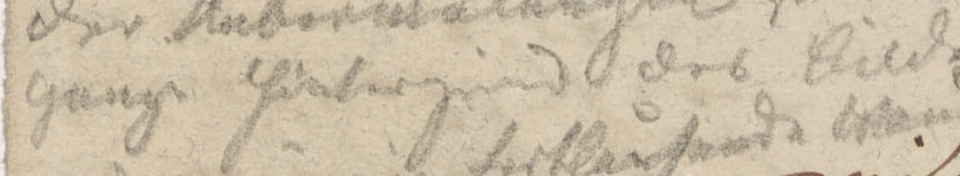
ganze Hintergrund des Bildes
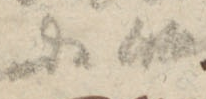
eine einzige
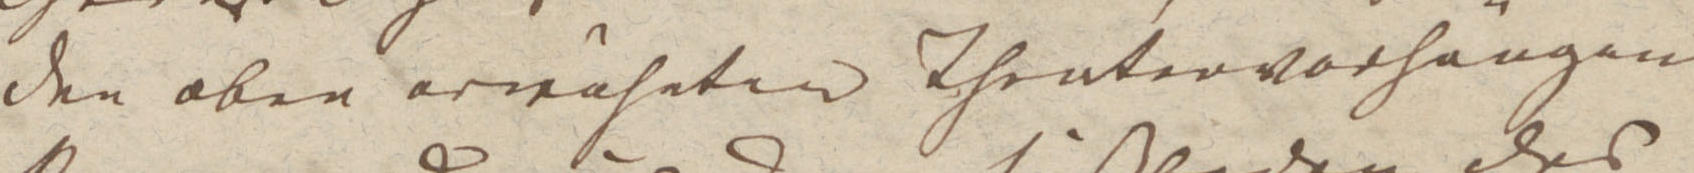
den oben erwähnten Theatervorhängen
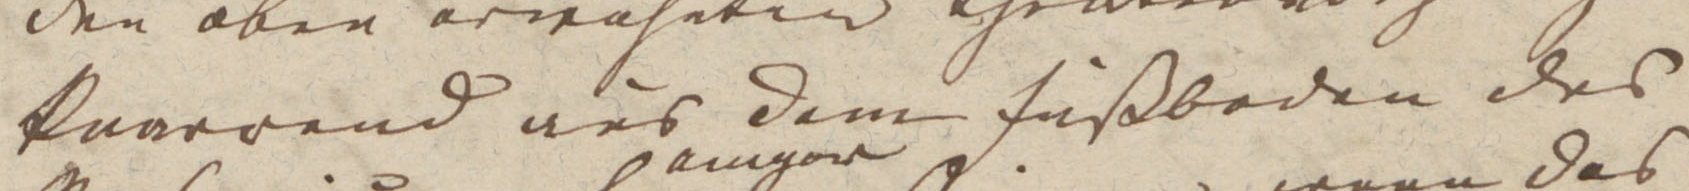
knarrend aus dem Fussboden des
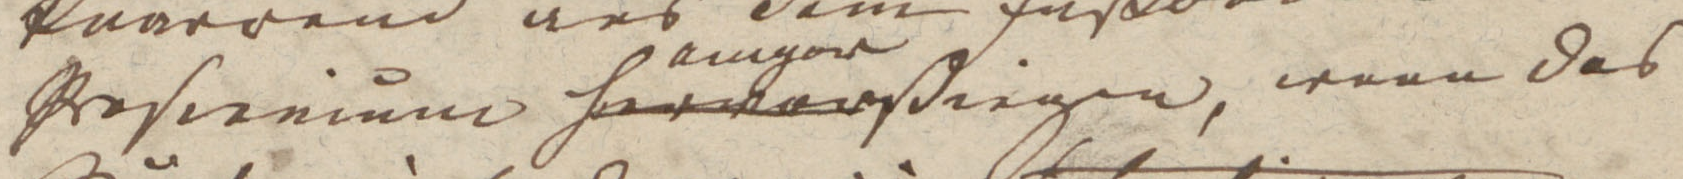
Proscenium hervoremporstiegen, wenn das
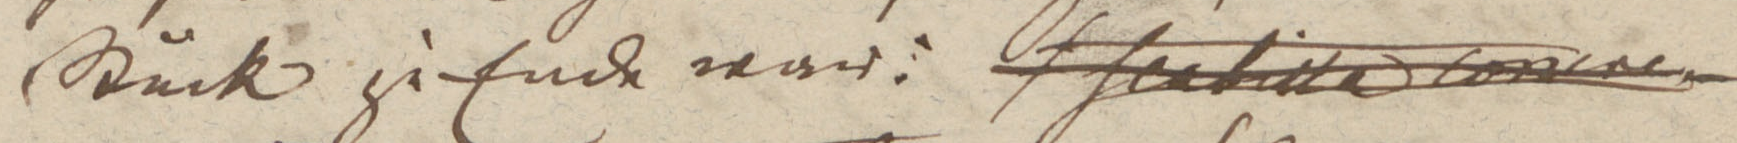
Stück zu Ende war: scabilla concre-
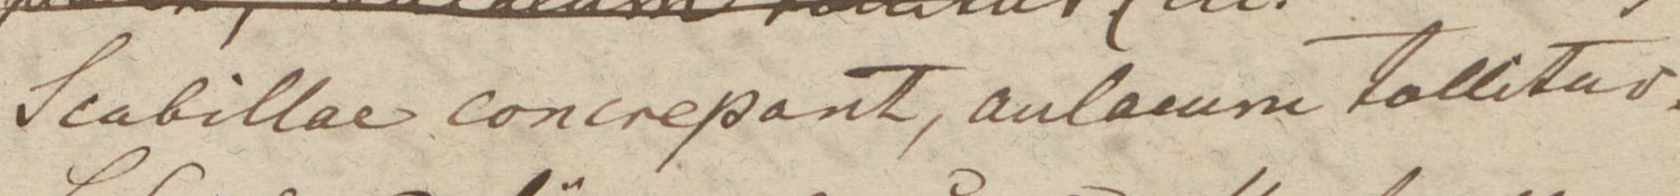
Scabillae concrepant, aulaeum tollitur.%
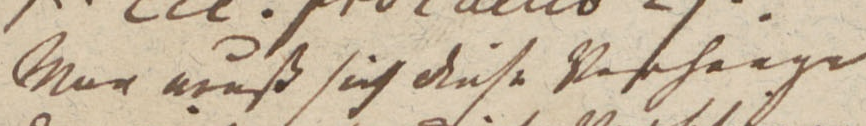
Man muss sich diese Vorhänge
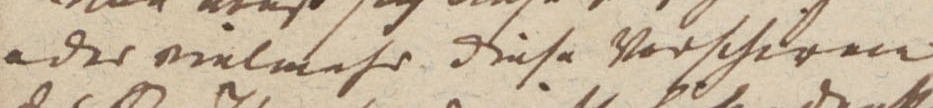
oder vielmehr diese Vorschirme
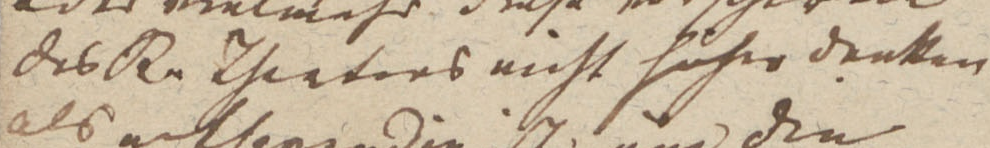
des R. Theaters nicht höher denken
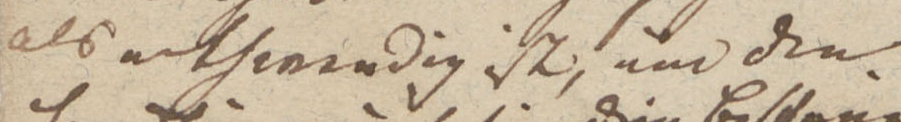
als nothwendig ist, um die
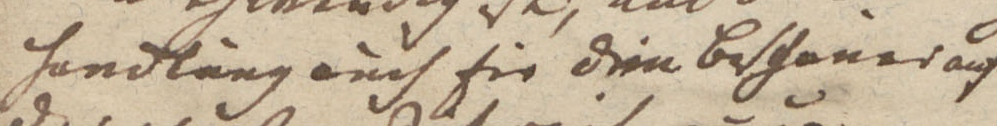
Handlung auch für dieen Beschauer auf
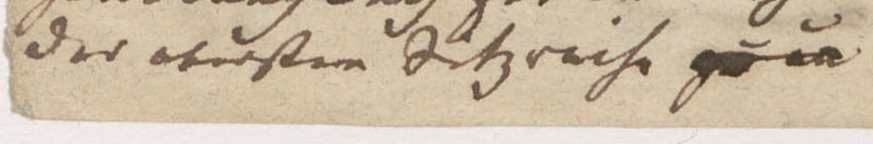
der obersten Sitzreihe zu
